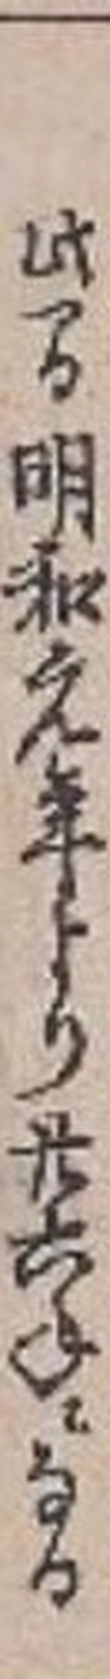此間明和元年より廿六年になる
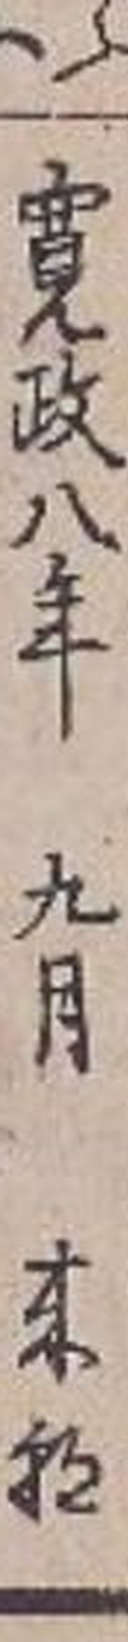寛政八年九月来朝
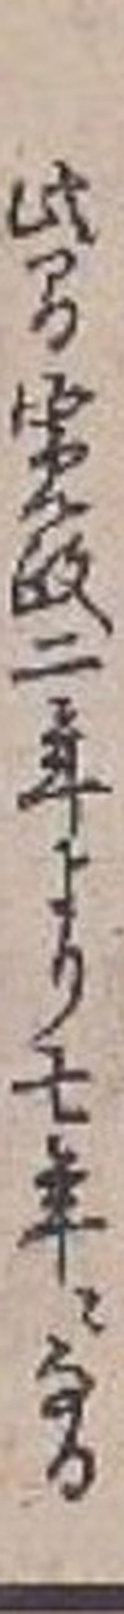此間寛政二年より七年になる
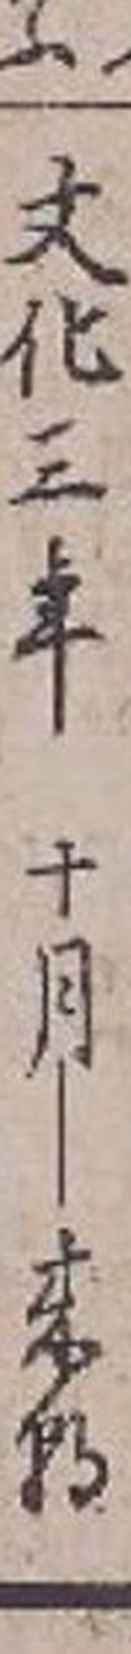文化三年拾月来朝
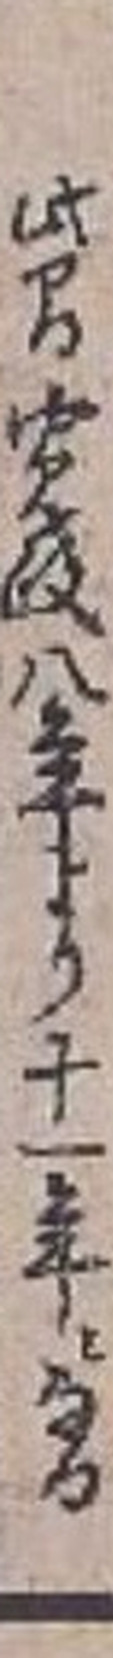此間寛政八年より十一年になる
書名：琉球人大行列記 来朝新板絵入
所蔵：University of the Ryukyus Library
